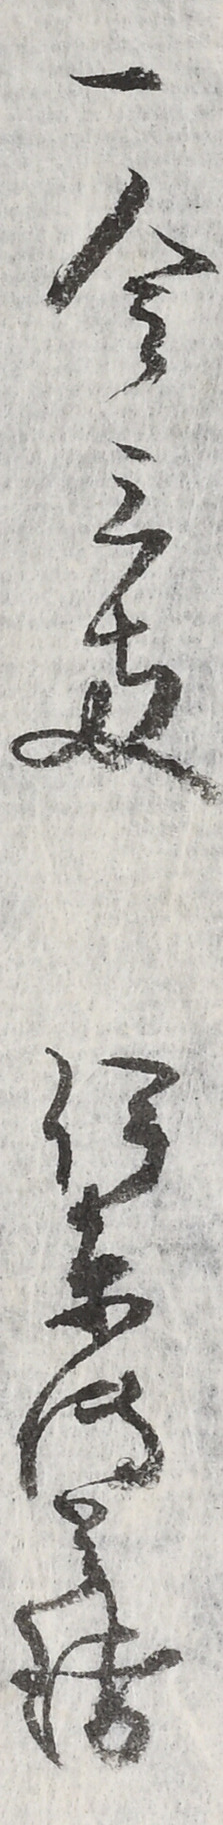一金三両伊東伝兵衛
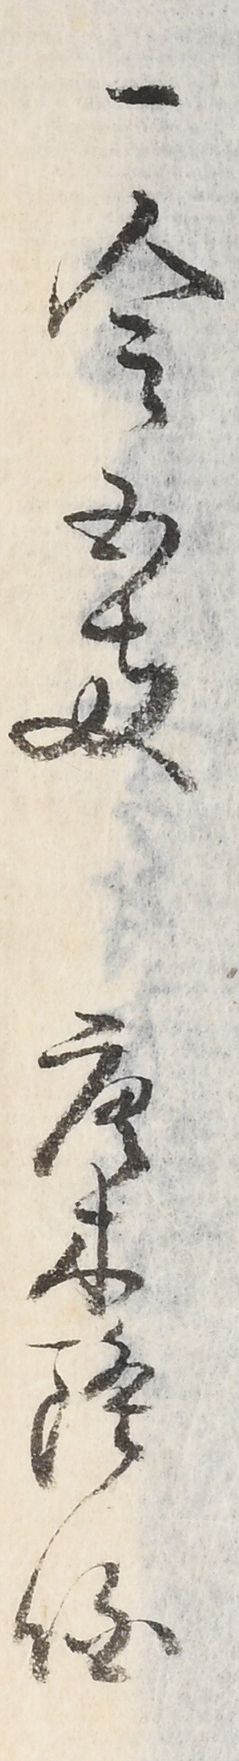一金五両唐木隆伯
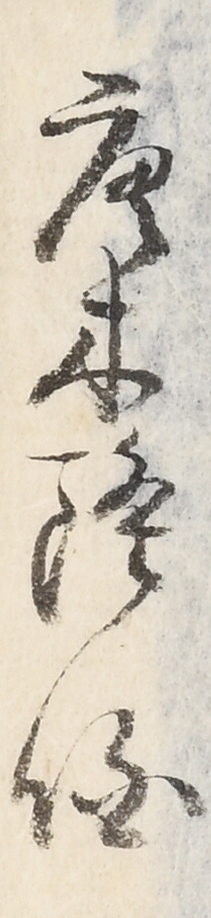唐木隆伯
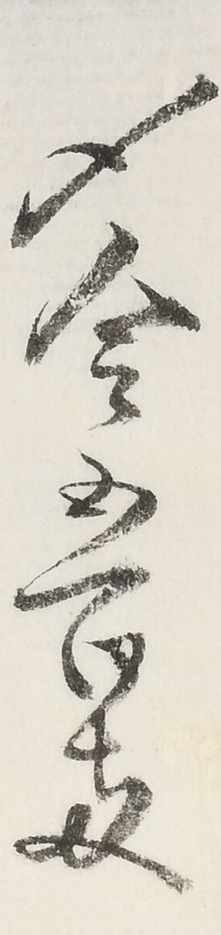〆金五百両
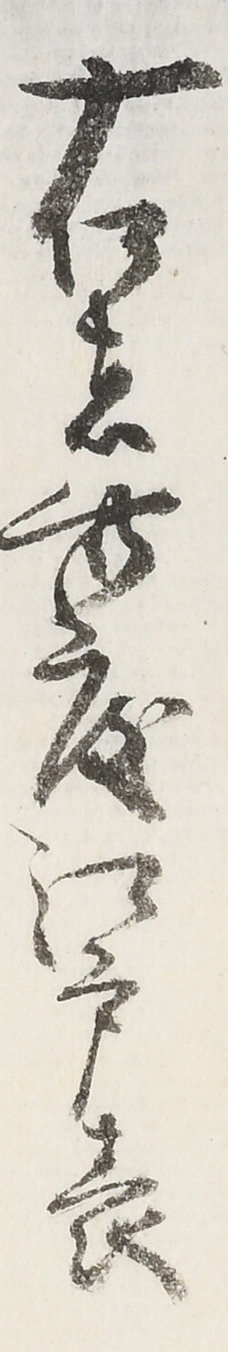右は此度江戸表
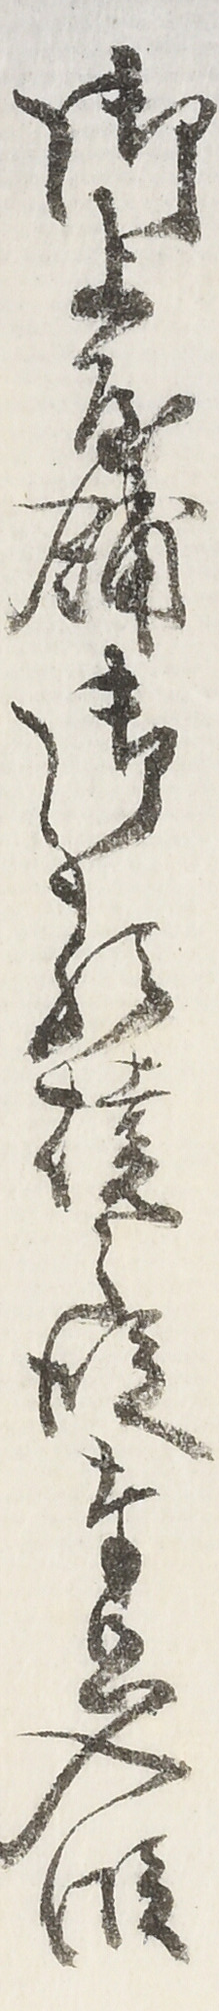御上屋敷御類焼之段奉恐入段
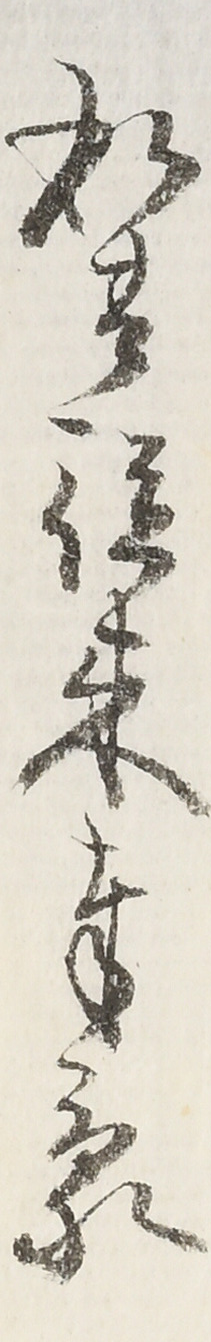私共往来奉蒙
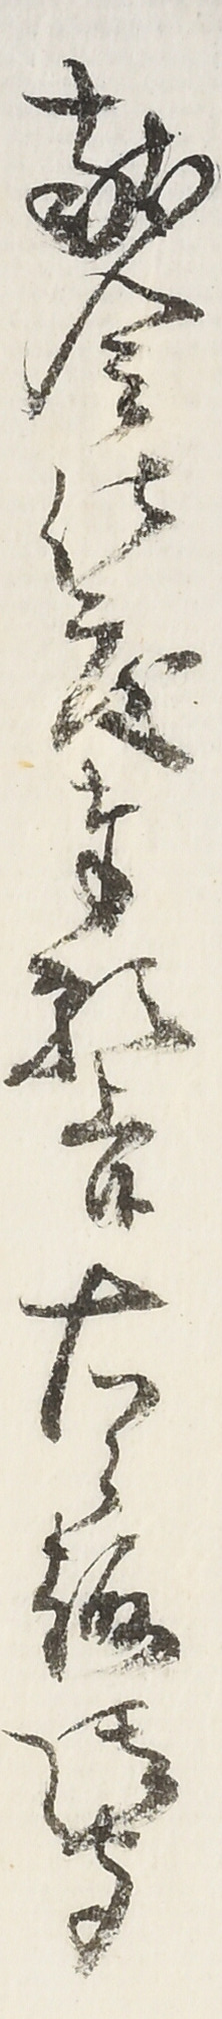献金仕度奉願上候右之趣御聞
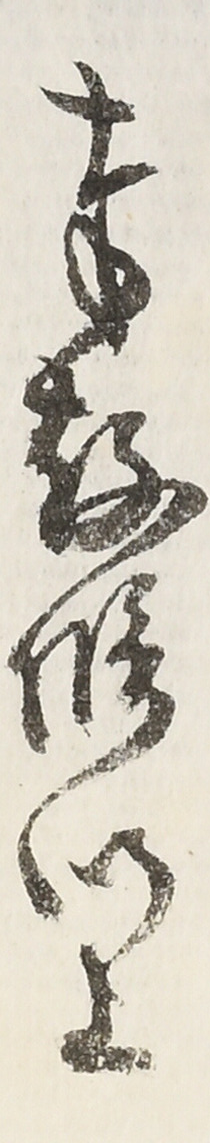奉存候以上
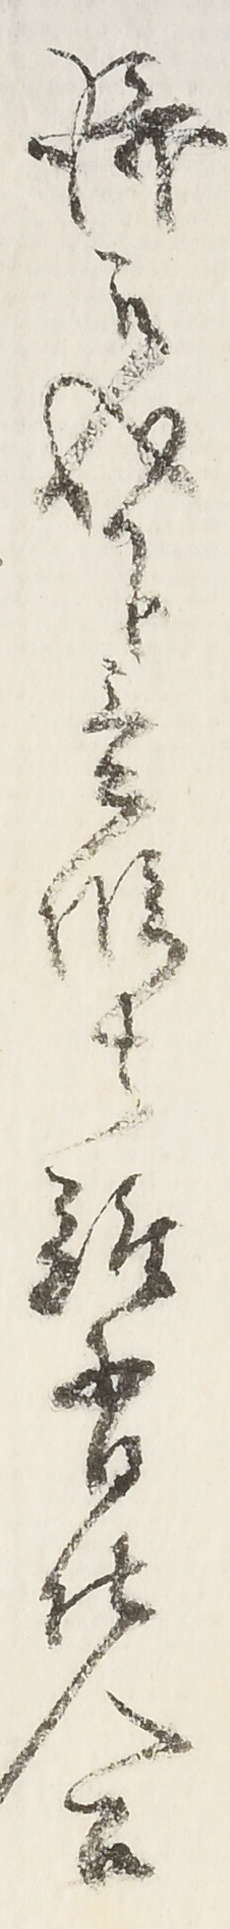済被成下置候は難有仕合
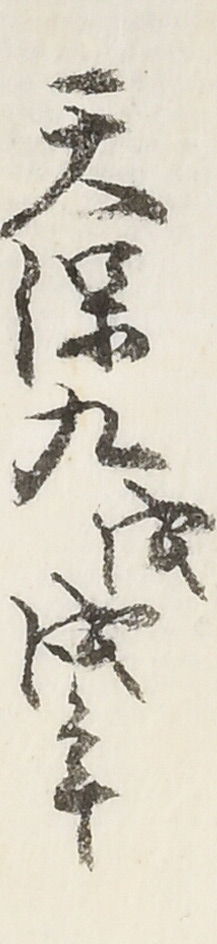天保九戊戌年
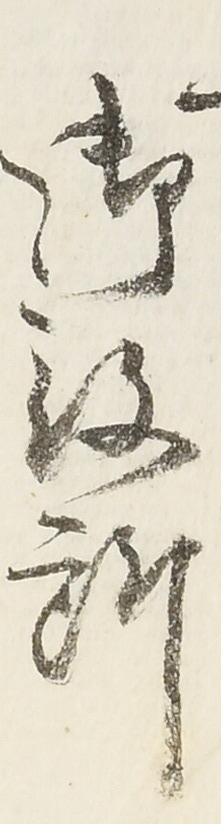御役所
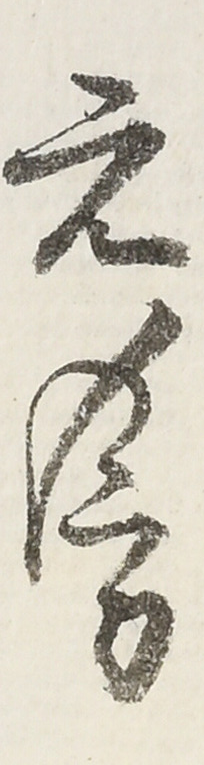元〆方
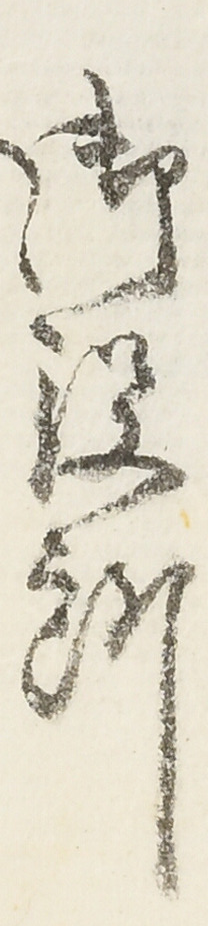御役所

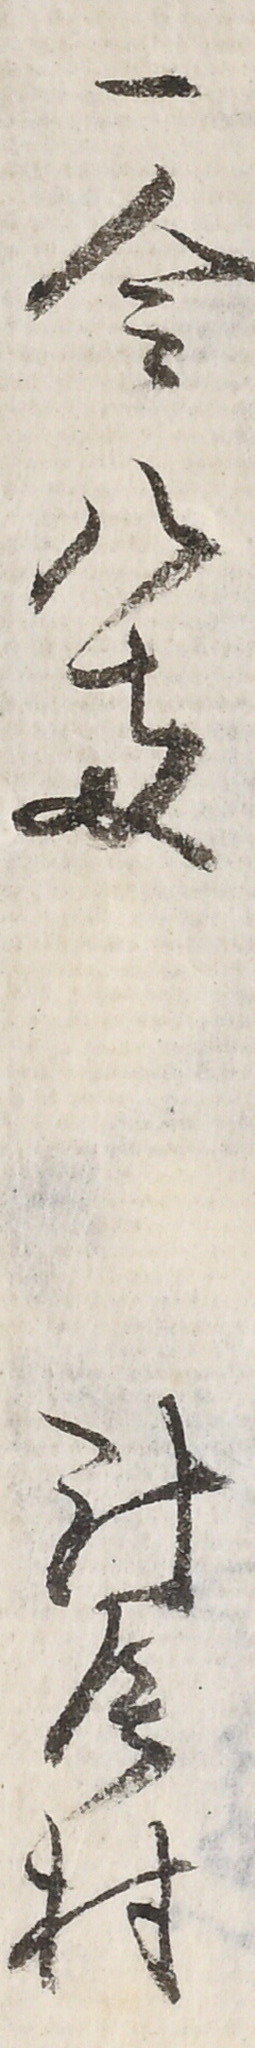一金八両針尾村
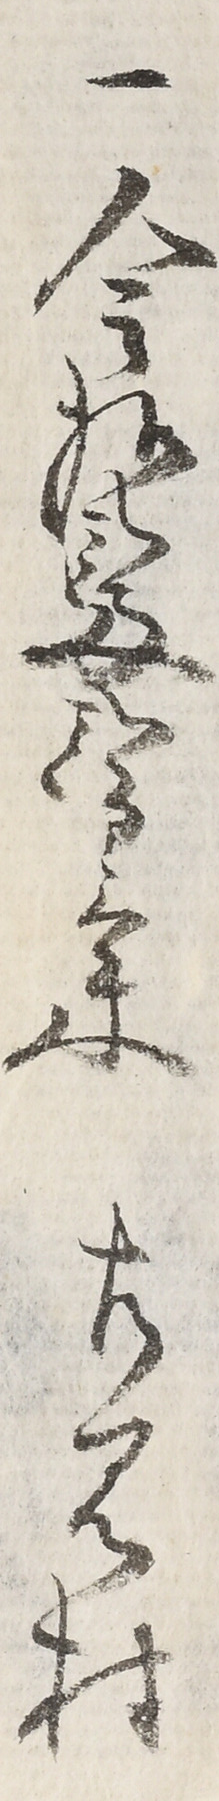一金拾弐両弐分三朱古見村
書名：在町帯刀献金割帳
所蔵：伊那市立高遠町図書館・合同会社AMANE
